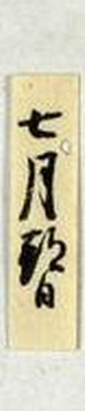正月朔日
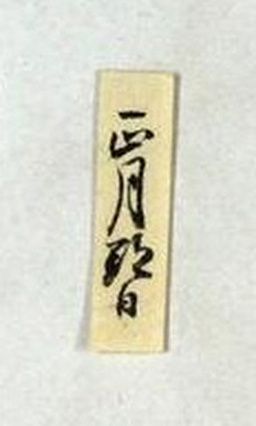正月朔日
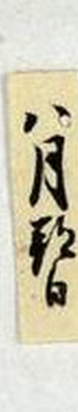正月朔日
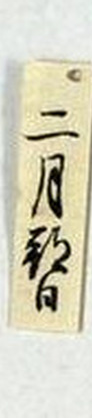二月朔日
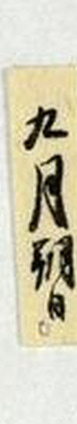正月朔日
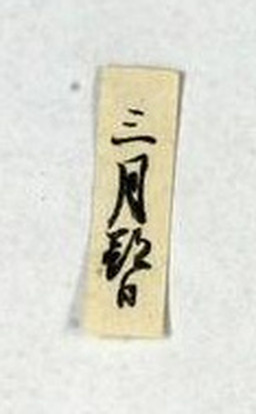三月朔日
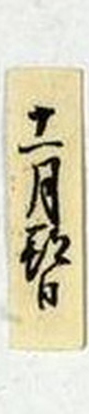十一月朔日
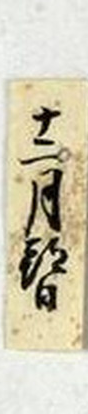十二月朔日

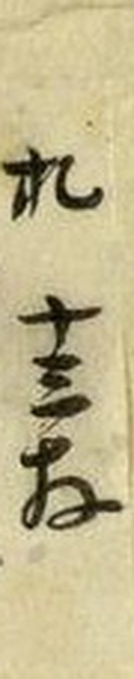札十三枚
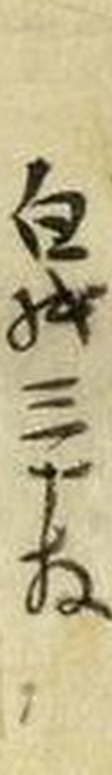白紙三十枚
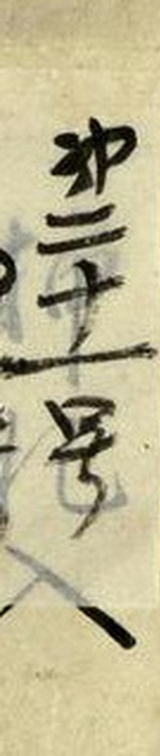第二十一号
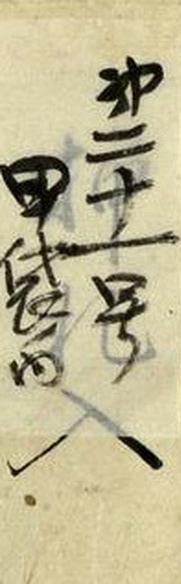第二十一号
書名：少傅日録抄（斉承付側向頭取日記、在府）
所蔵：福井県文書館 Fukui Prefectural Archives
